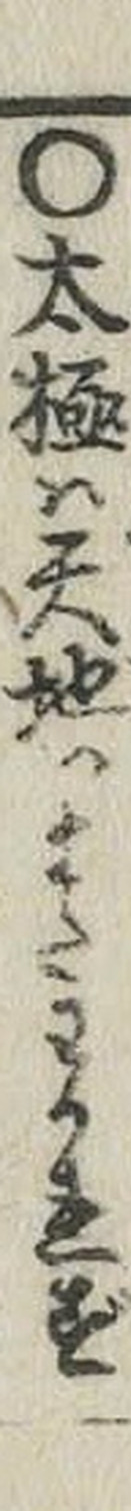○太極は天地いまたわかれず
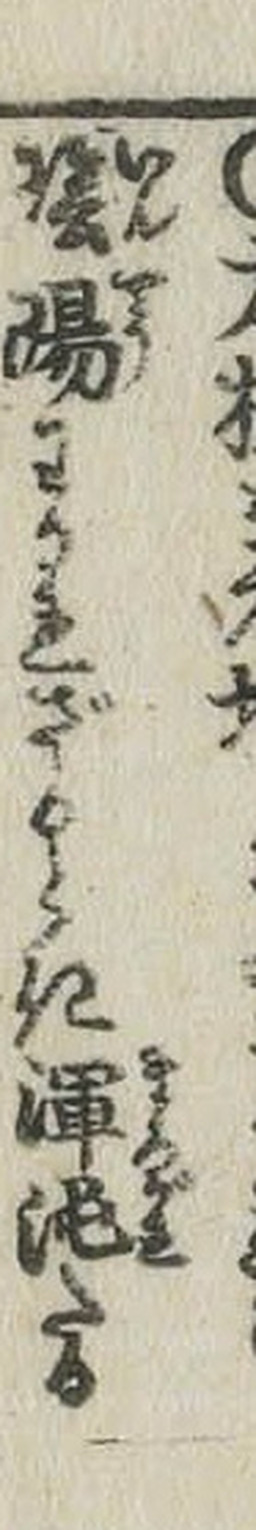陰陽わかれざるとき渾沌たる
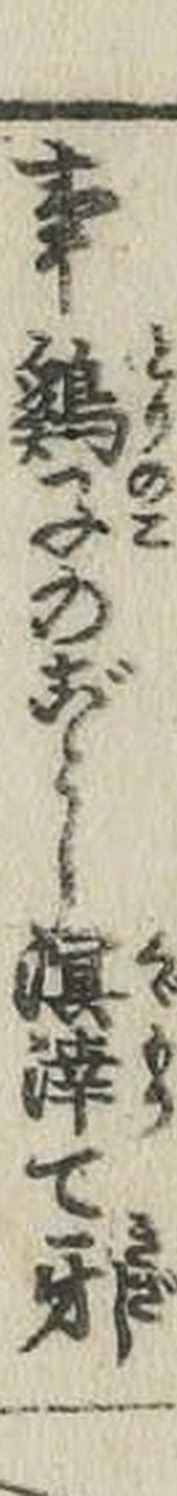事鶏子のごとし溟涬て牙
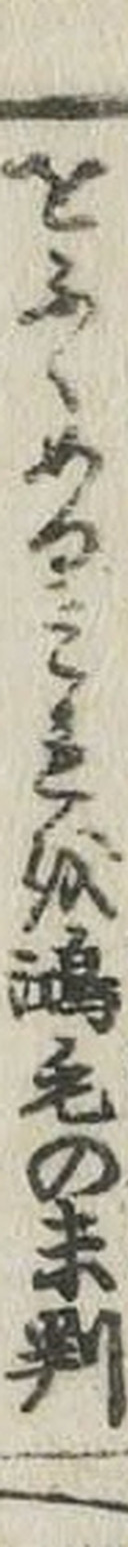をふくめりこれを鴻毛の未判
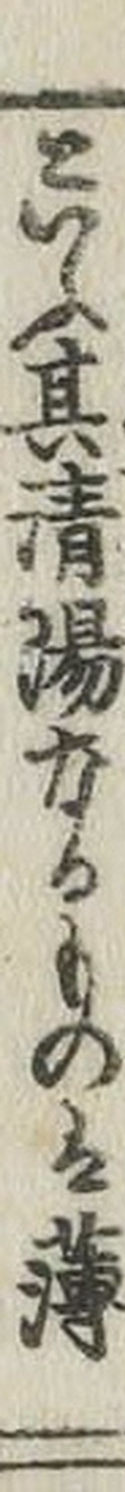といふ其清陽なるものは薄
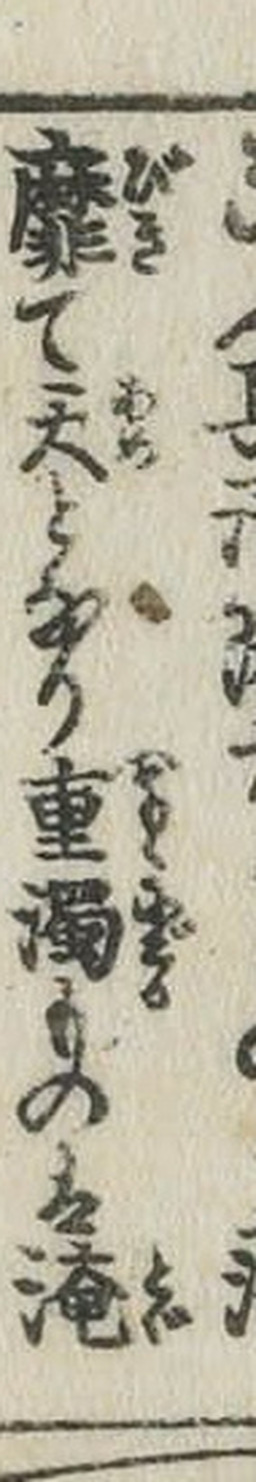靡て天となり重濁ものは淹
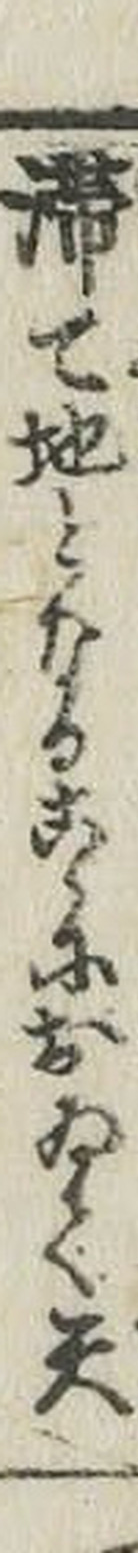滞て地となるこゝにおゐて天
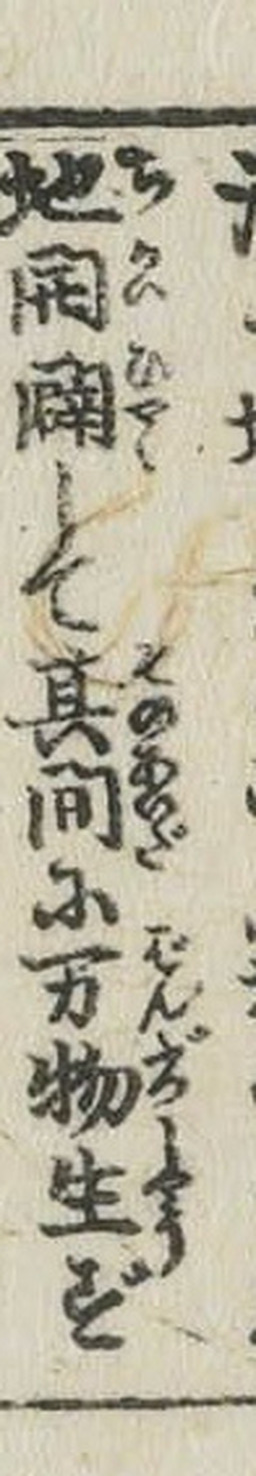地開闢して其間に万物生ず
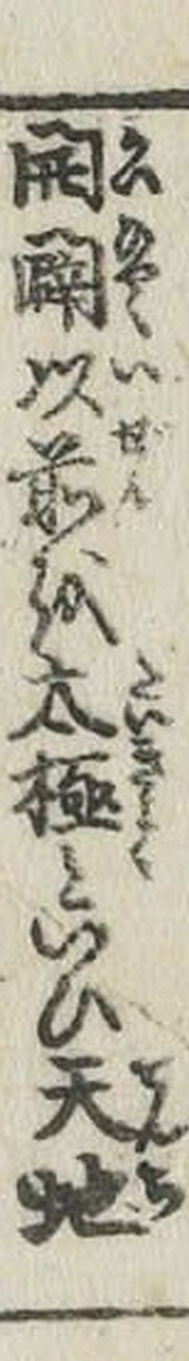開闢以前を太極といひ天地
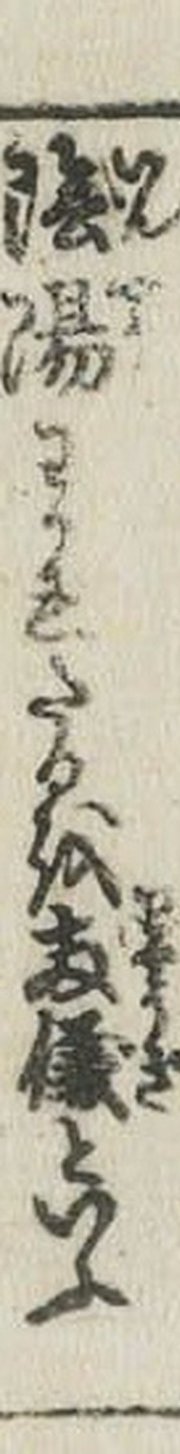陰陽わかれたるを両儀といふ
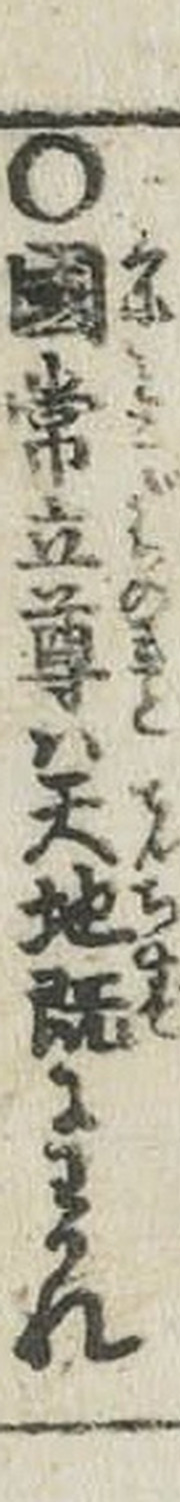○国常立尊は天地既にわかれ
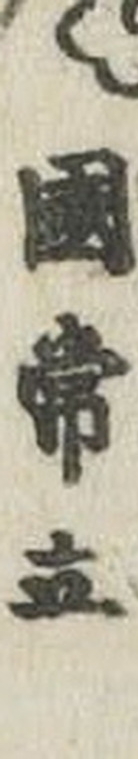国常立
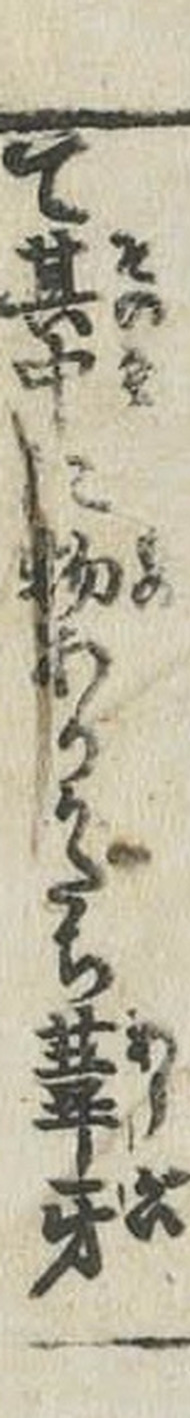て其中に物ありかたち葦牙
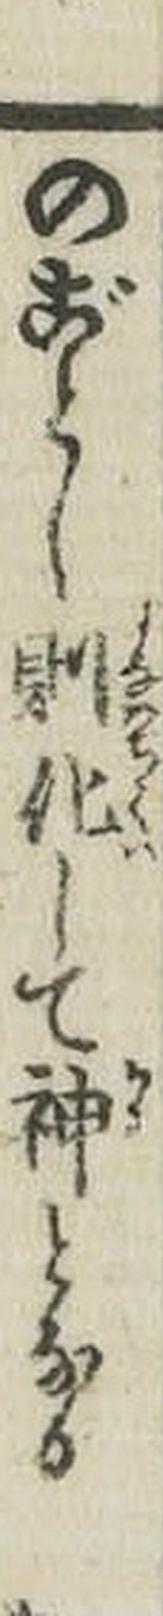のごとし則化して神となる
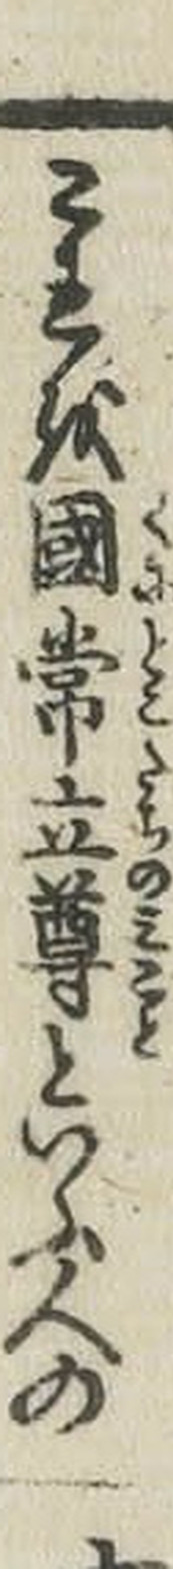これを国常立尊といふ人の
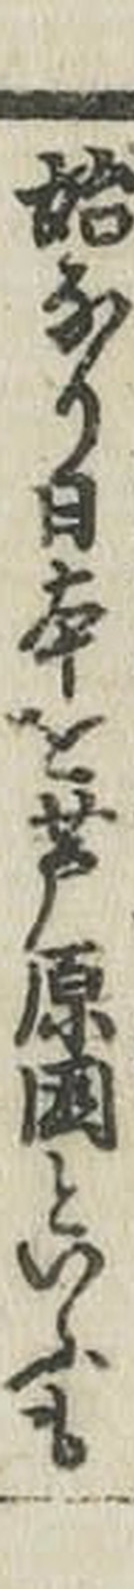始なり日本を芦原国といふも
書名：増補頭書訓蒙図彙大成 10巻 2:巻之1-3
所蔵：東京学芸大学教育コンテンツアーカイブ
